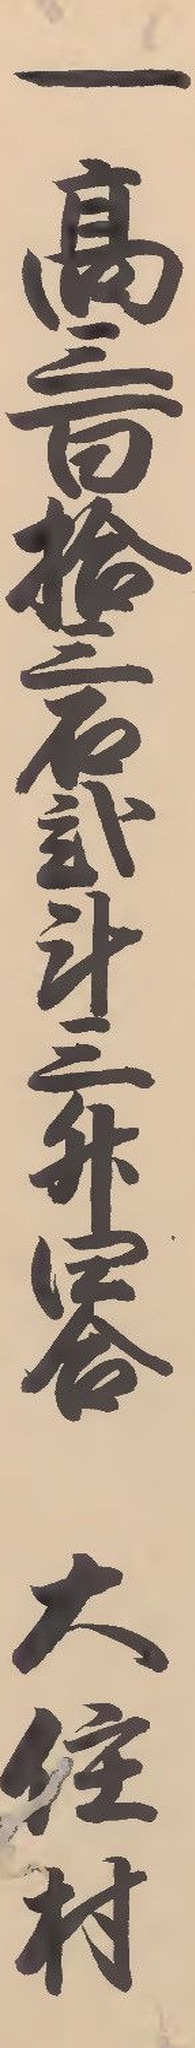一高三百拾三石弐斗三升四合大住村
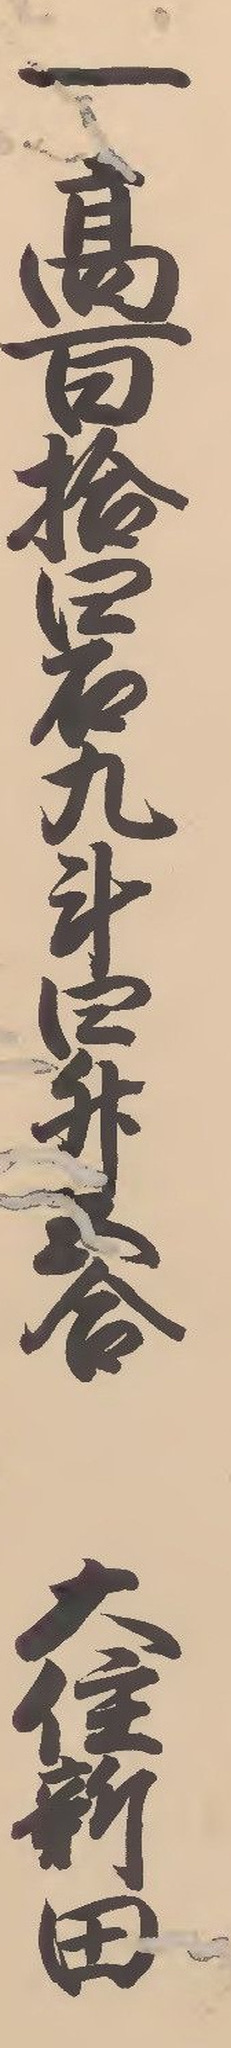一高百拾四石九斗四升五合大住新田

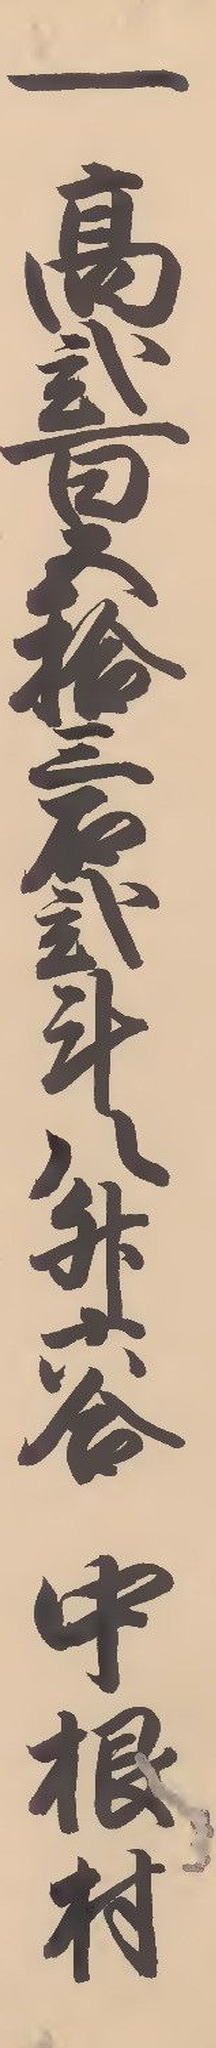一高弐百五拾三石弐斗八升六合中根村
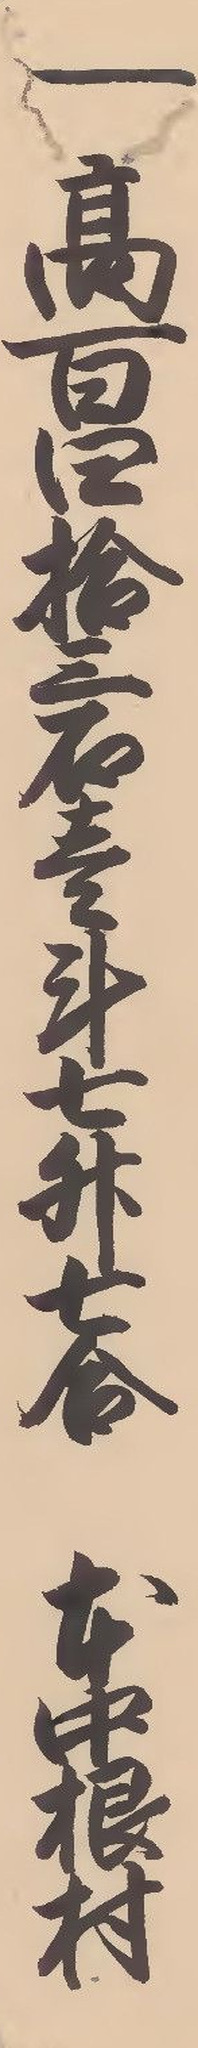一高百四拾三石壱斗七升七合本中根村
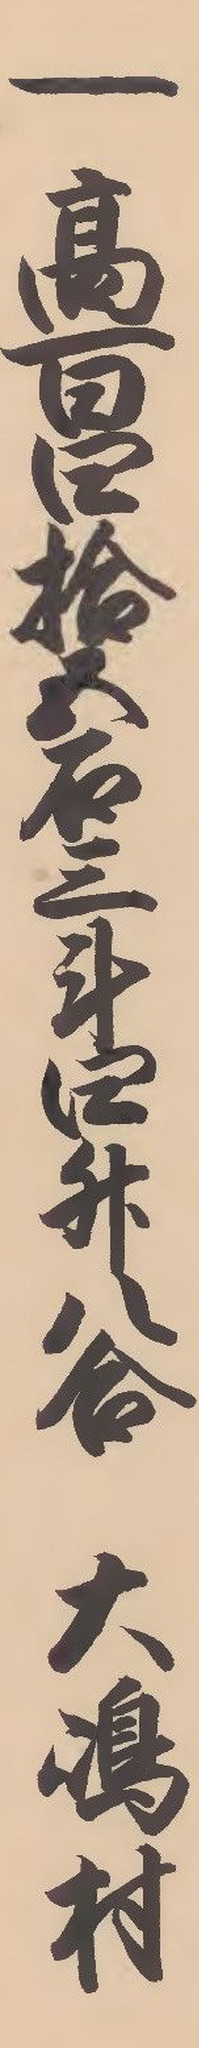一高百四拾五石三斗四升八合大島村
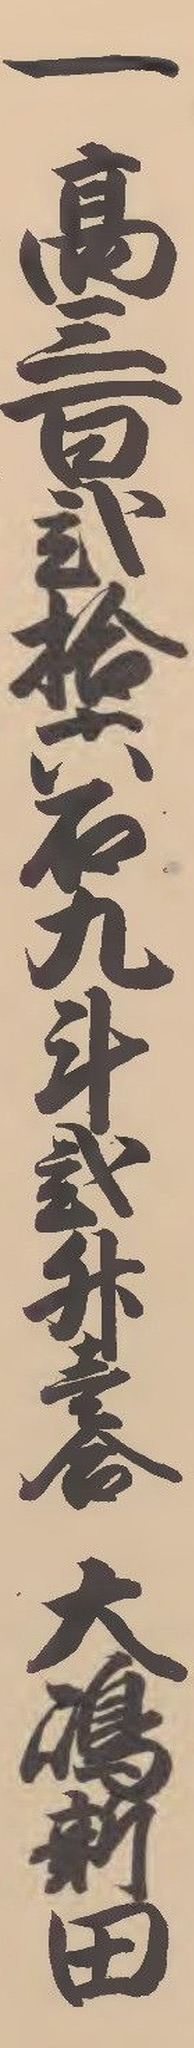一高三百弐拾六石九斗弐升壱合大島新田
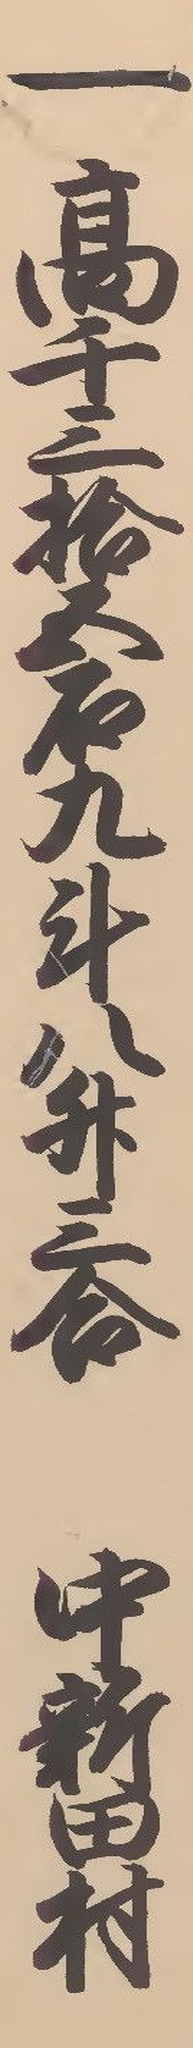一高千三拾五石九斗八升三合中新田村
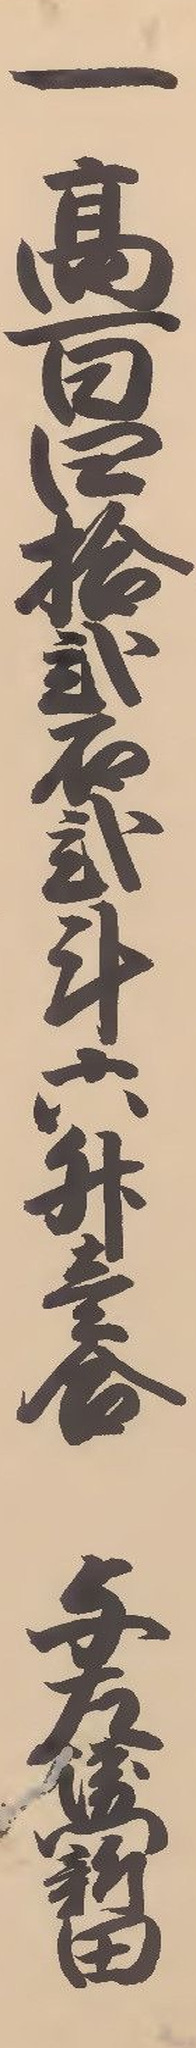一高百四拾弐石弐斗六升壱合与左衛門新田
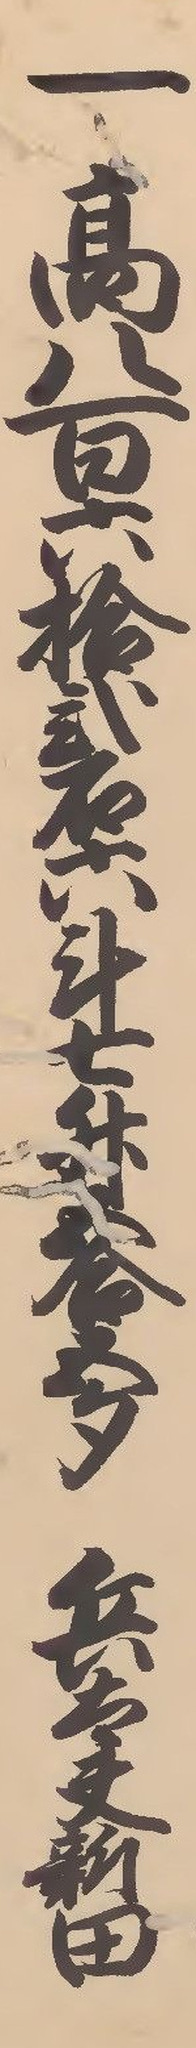一高八百六拾弐石六斗七升五合五勺兵太夫新田

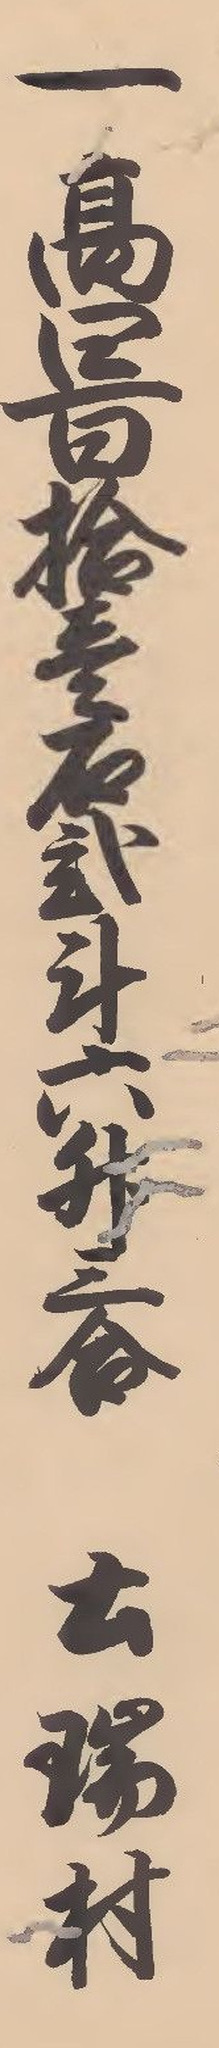一高四百拾壱石弐斗六升三合土瑞村
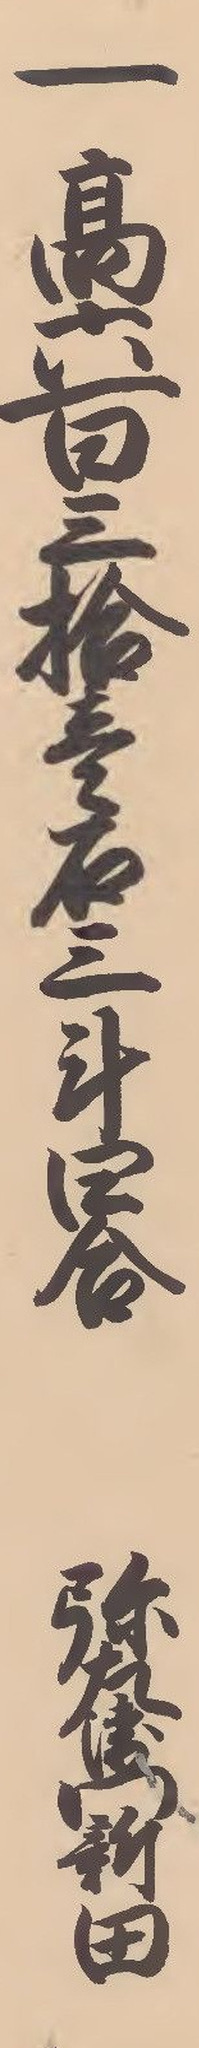一高六百三拾壱石三斗四合弥左衛門新田
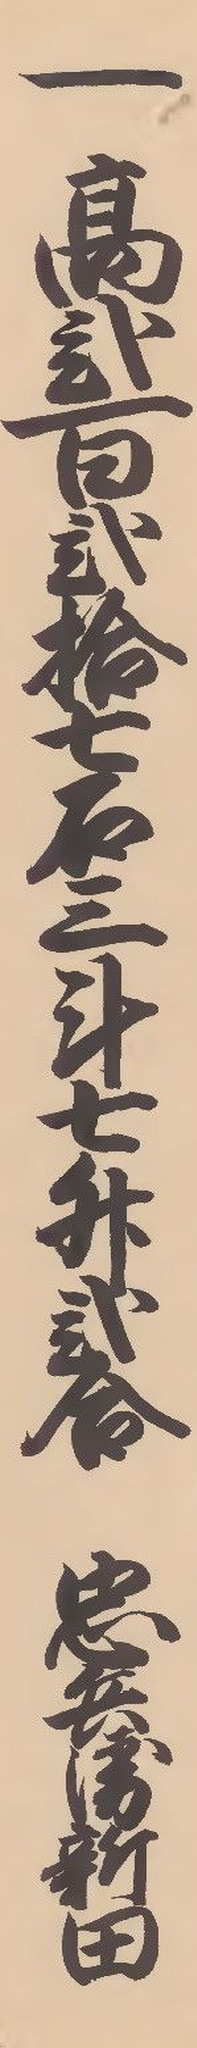一高弐百弐拾七石三斗七升弐合忠兵衛新田
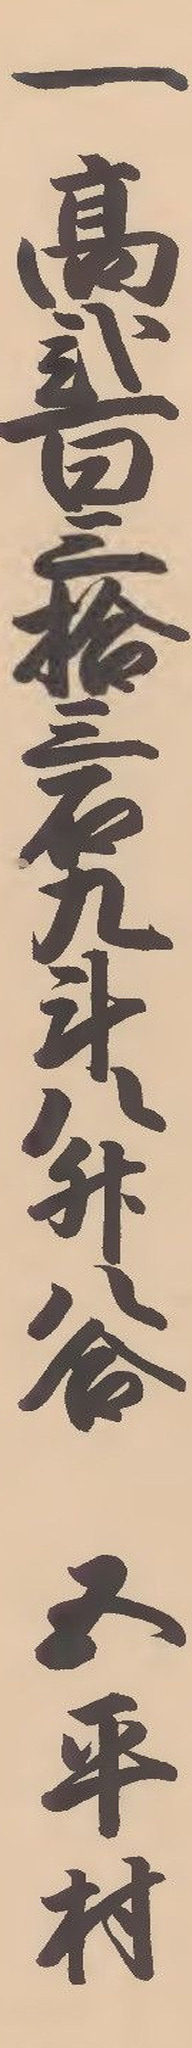一高弐百三拾三石九斗八升八合五平村
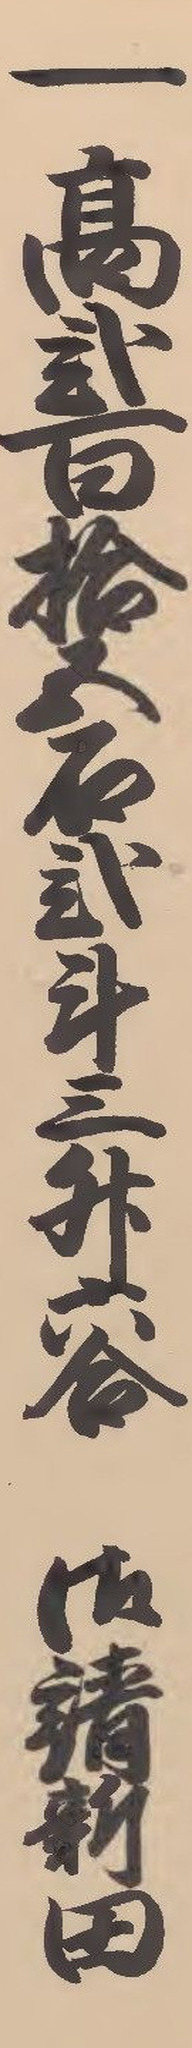一高弐百拾五石弐斗三升六合御請新田
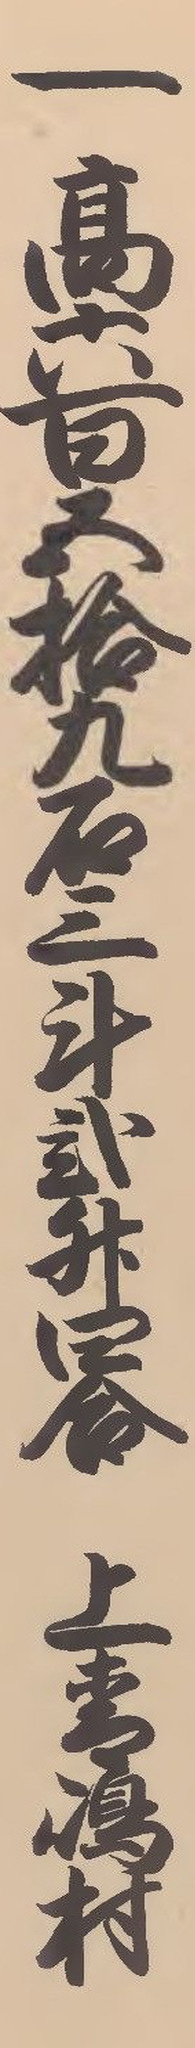一高六百五拾九石三斗弐升四合上青島村
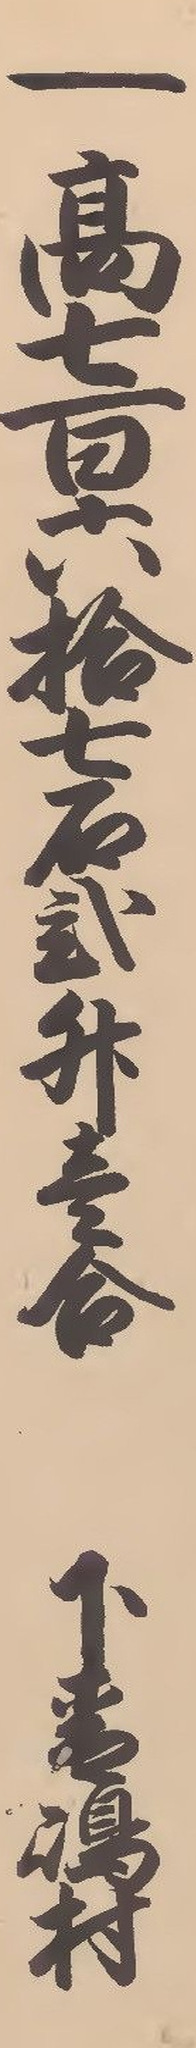一高七百六拾七石弐升壱合下青島村
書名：駿河国郷帳
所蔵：国立公文書館 National Archives of Japan
